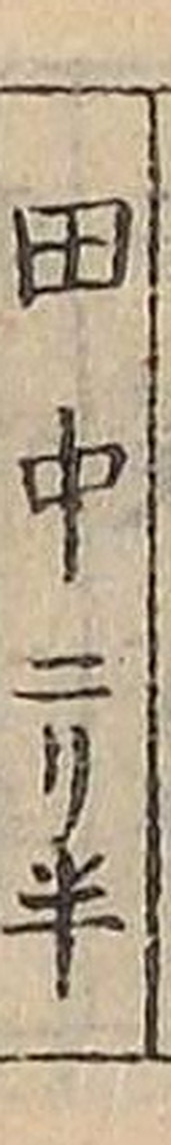田中二リ半
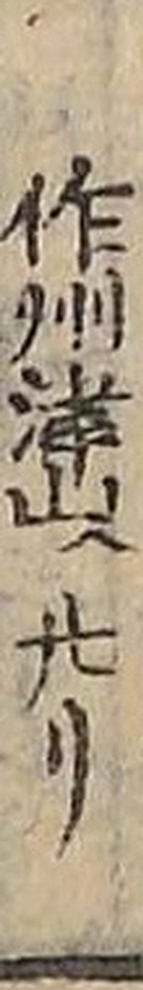作州津山へ廿リ
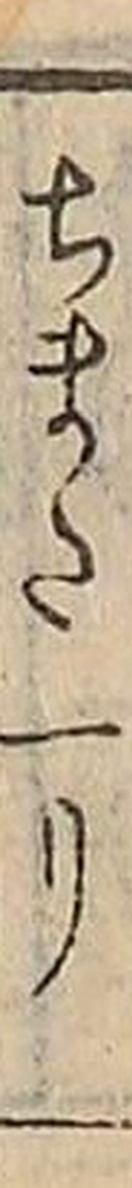ちまた一リ
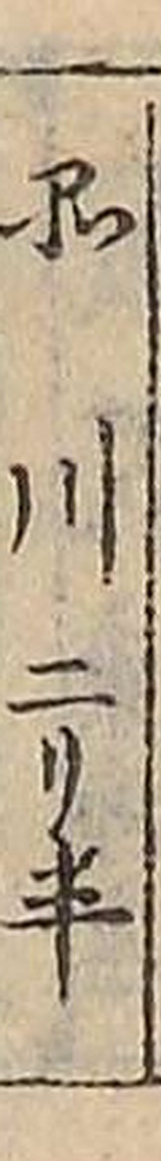品川二リ半
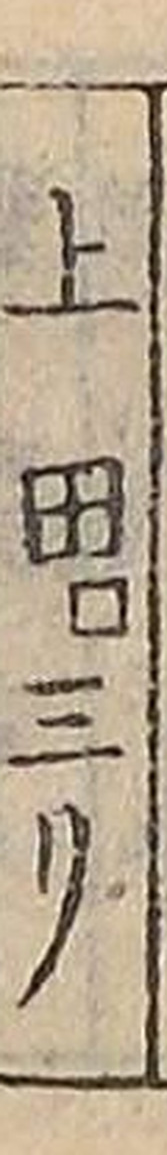上田▫三リ
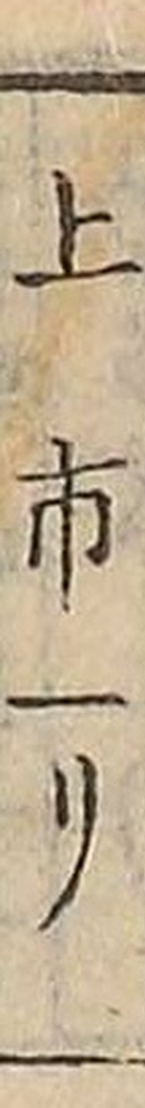上市一リ
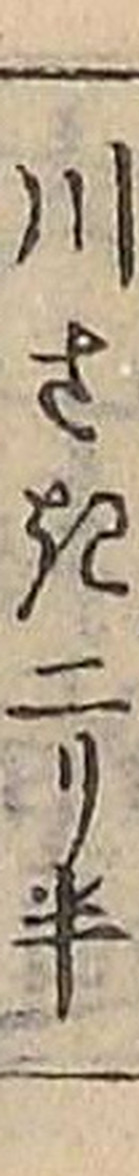川さき二リ半
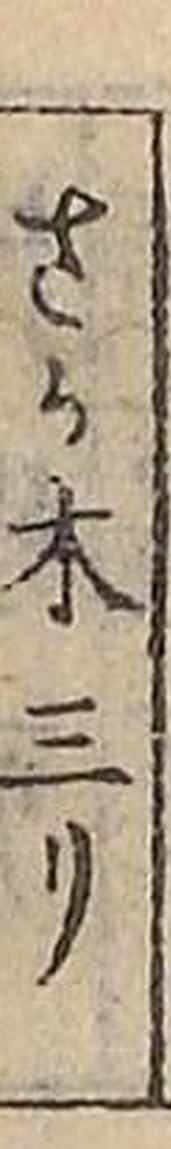さか木三リ
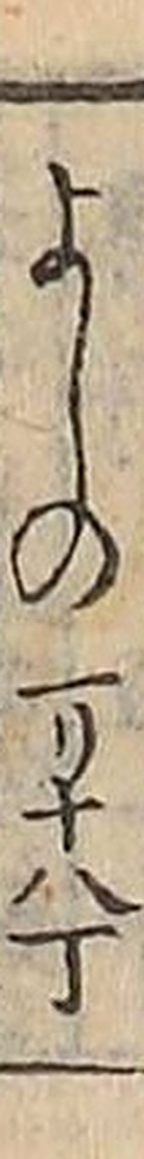よしの一リ十八丁
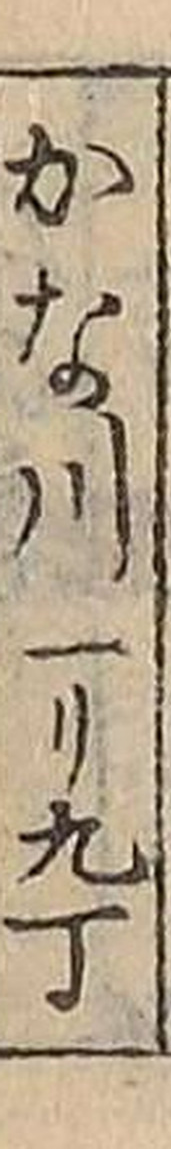かな川一リ九丁
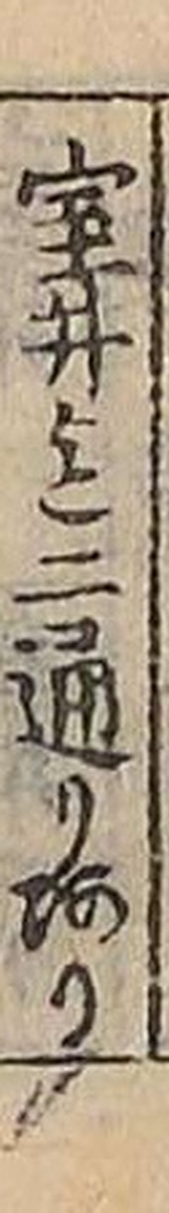室井迄二通りあり
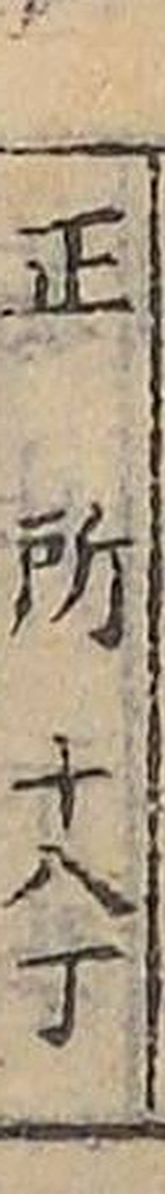正所十八丁
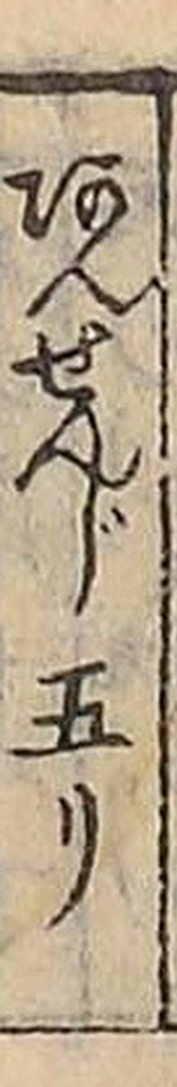あんせんじ五リ
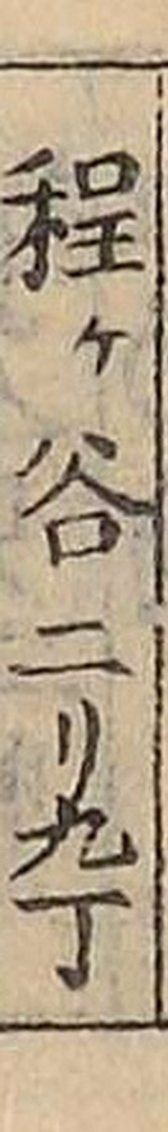程ケ谷二リ九丁
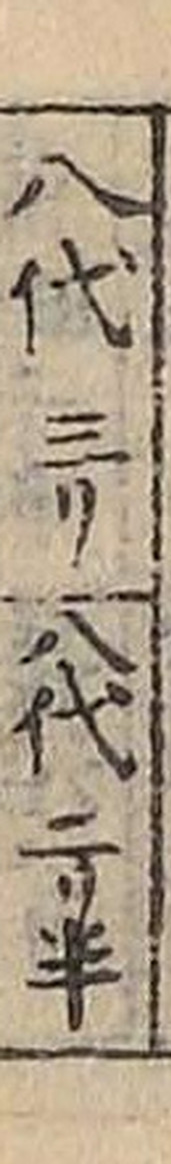八代三リ八代二リ半
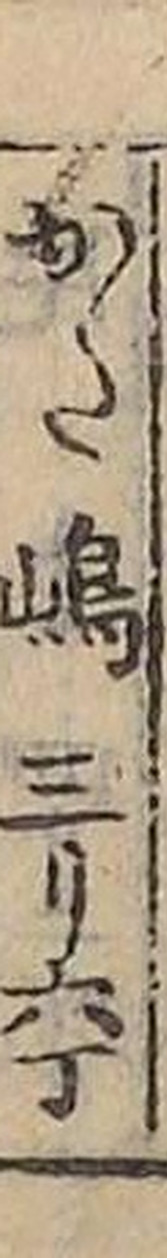かた島三リ六丁
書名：旅行用心集
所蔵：神戸大学附属図書館 国文学研究資料館
